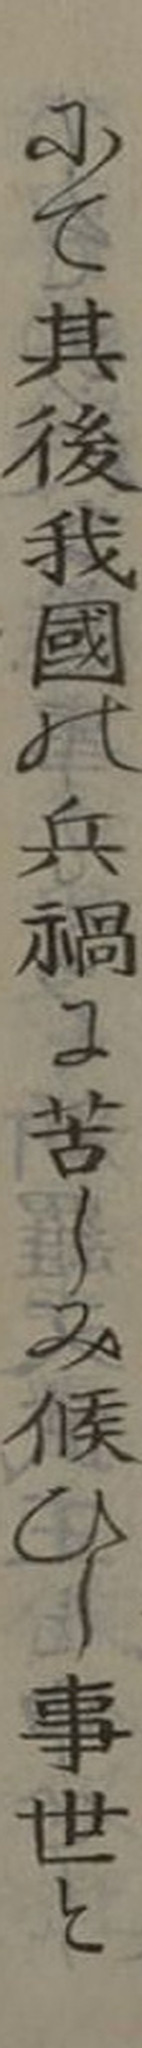にて其後我國の兵禍に苦しみ候ひし事世と

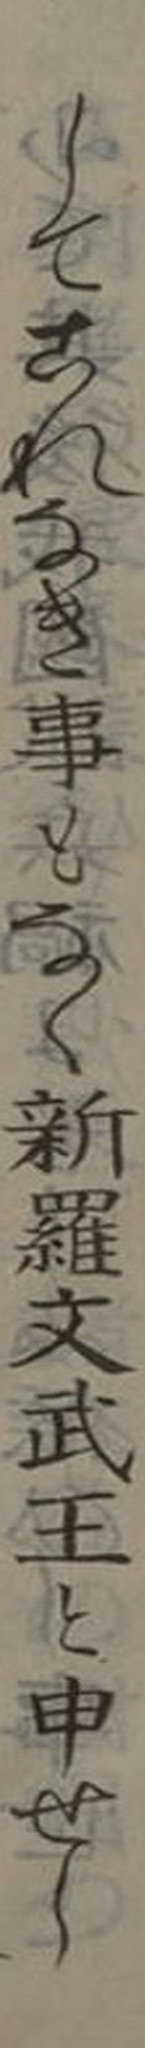してこれなき事もなく新羅文武王と申せし
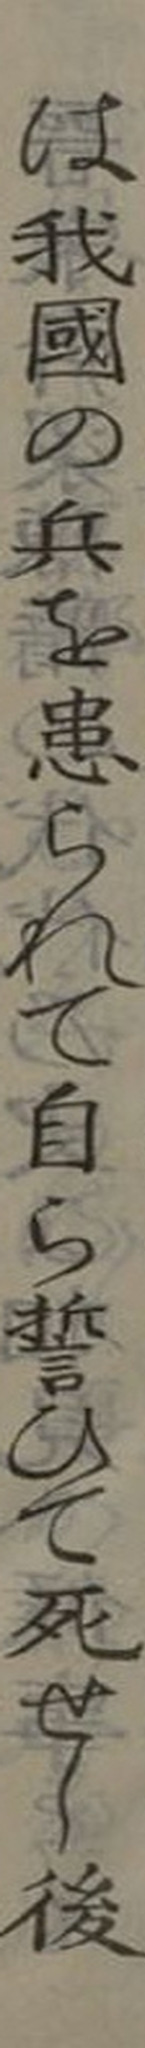は我國の兵を患られて自ら誓ひて死せし後
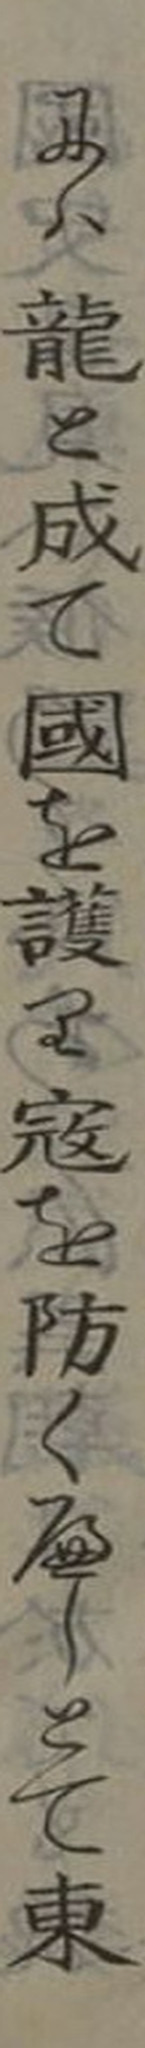には龍と成て國を護り寇を防くへしとて東
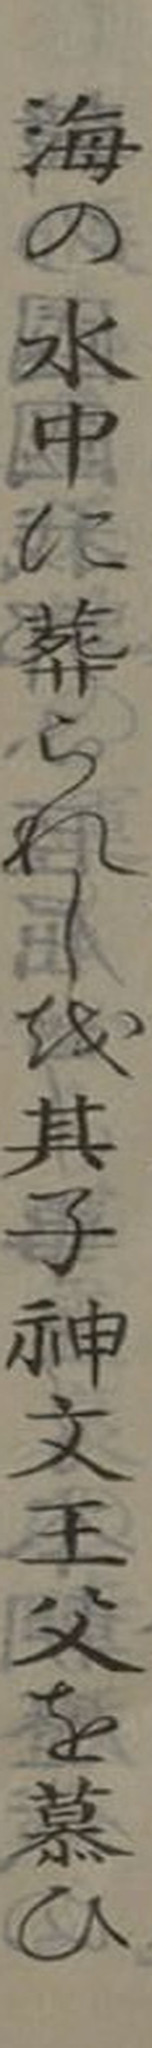海の水中に葬られし故其子神文王父を慕ひ
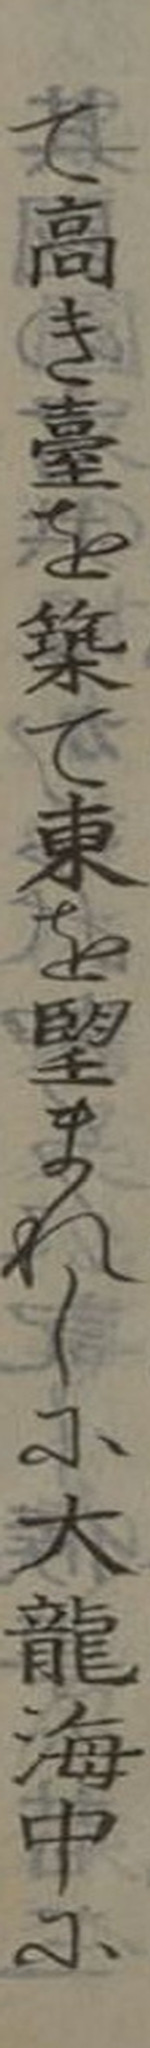て高き臺を築て東を朢まれしに大龍海中に
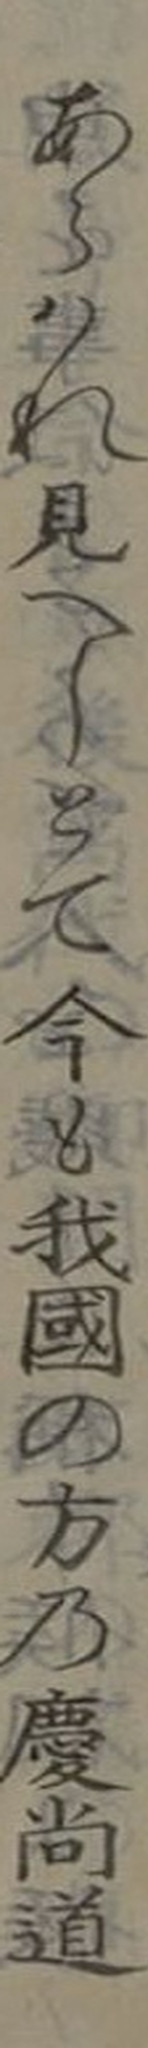あらはれ見へしとて今も我國の方の慶尚道
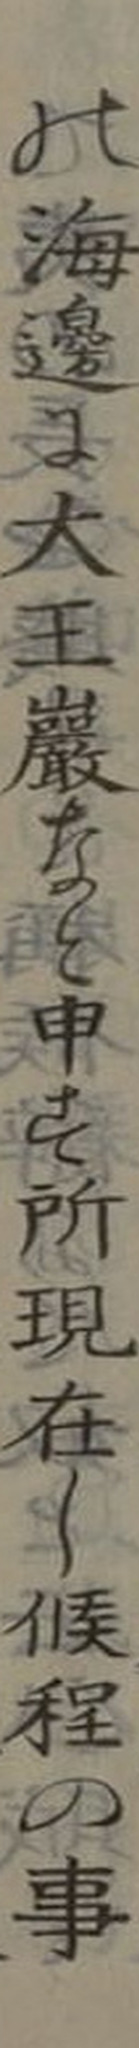の海邊に大王巖なと申す所現在し候程の事
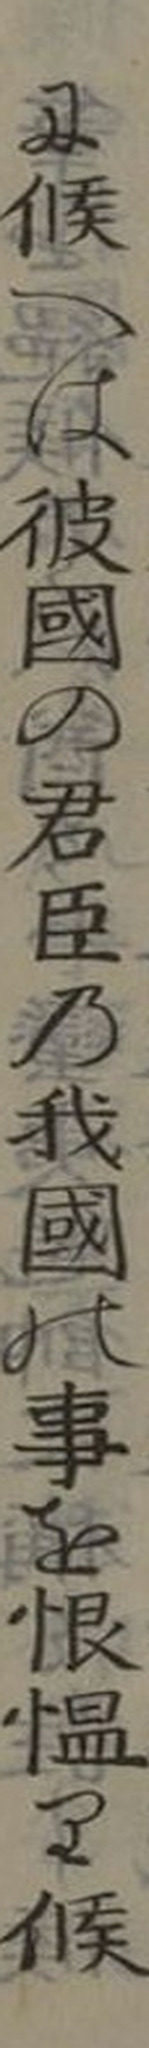に候へは彼國の君臣の我國の事を恨愠り候
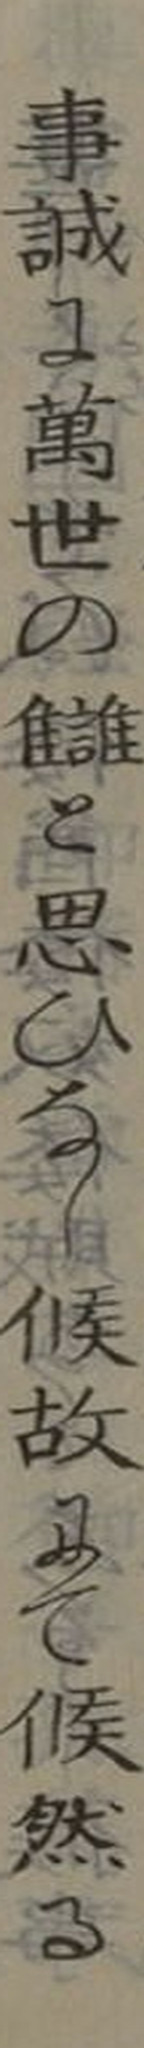事誠に萬世の讎と思ひなし候故にて候然る
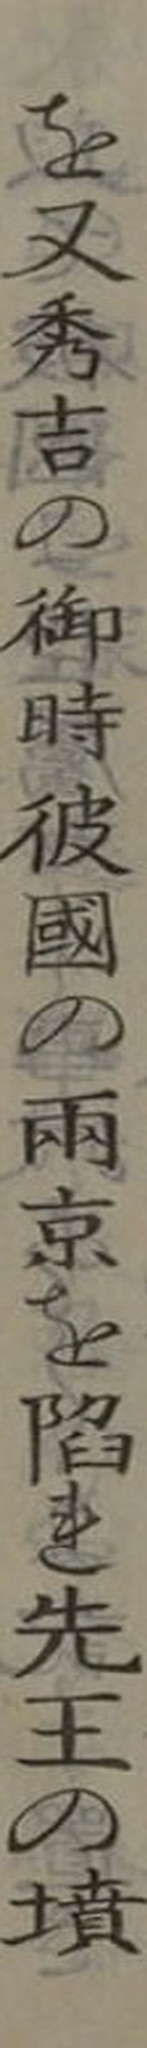を又秀吉の御時彼國の兩京を陷れ先王の墳
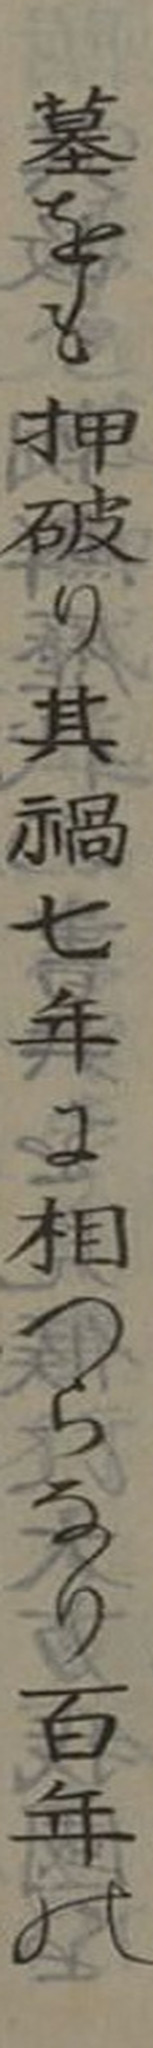墓をも押破り其禍七年に相つらなり百年の
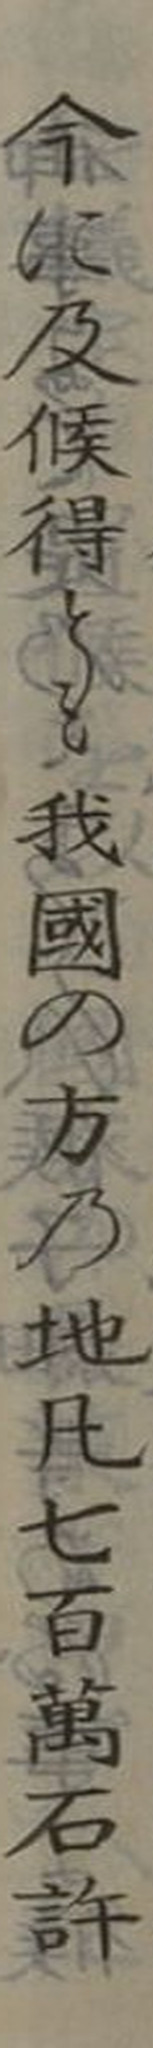今に及候得とも我國の方の地凡七百萬石許
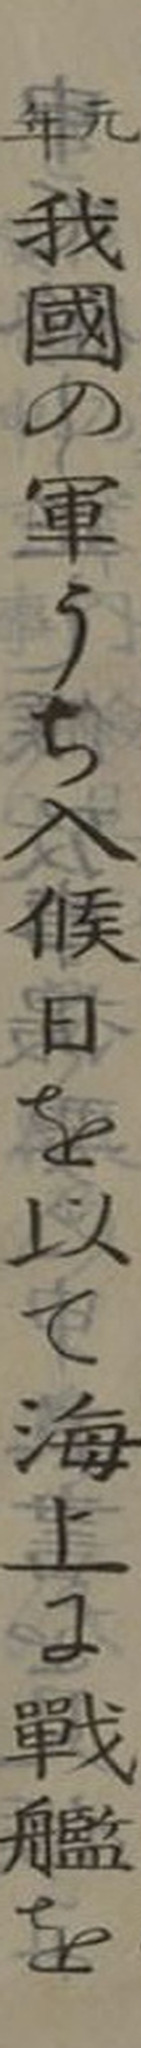元年我國の軍うち入候日を以て海上に戰艦を
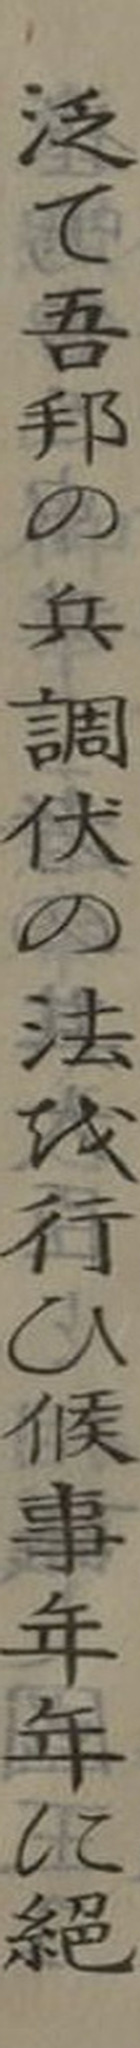泛て吾邦の兵調伏の法を行ひ候事年年に絶
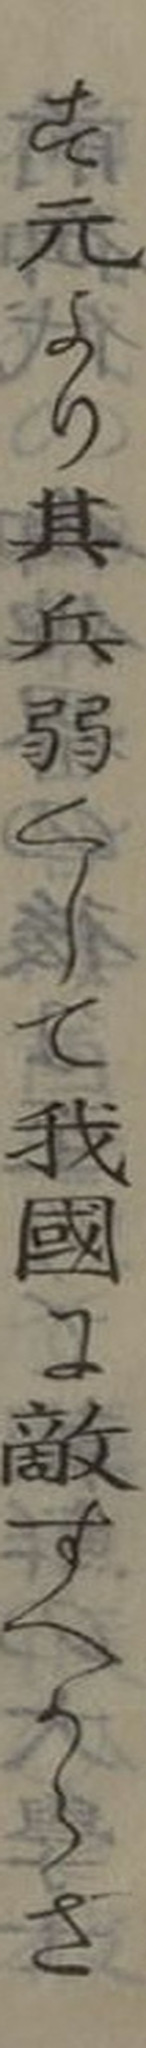す元より其兵弱くして我國に敵すへからさ
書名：骨董録
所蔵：University of the Ryukyus Library
